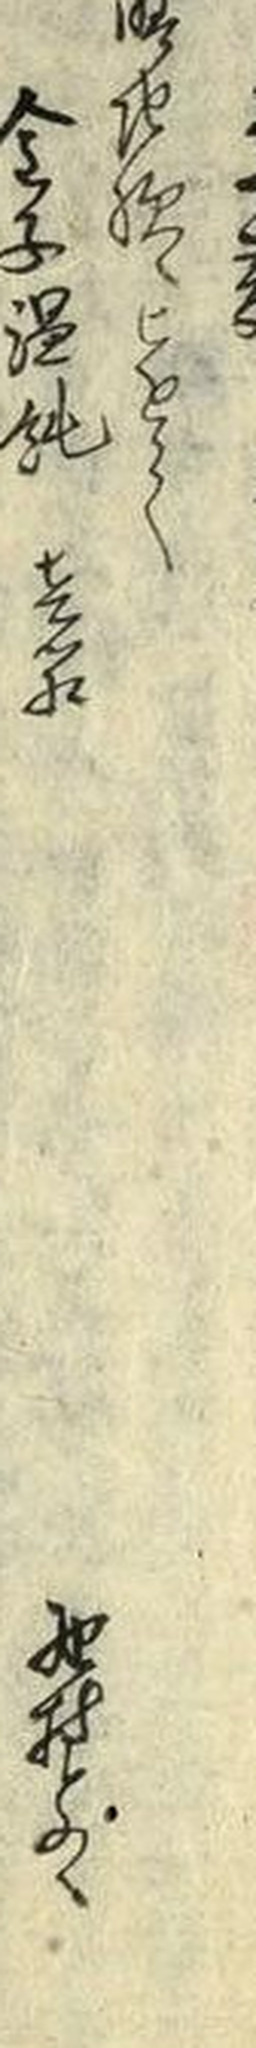金子饂飩壱箱野村とのへ
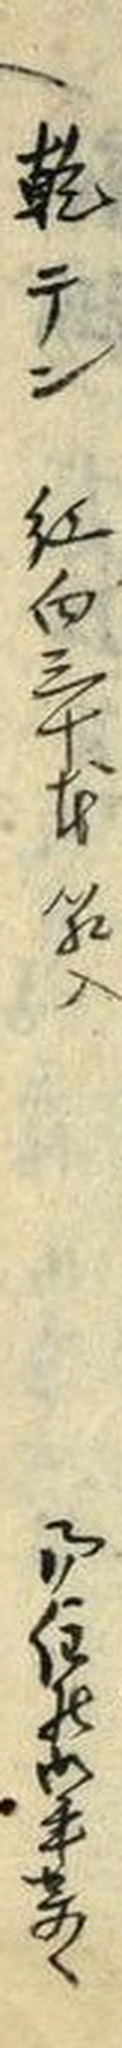乾テン紅白三十本箱入御住居御年寄へ

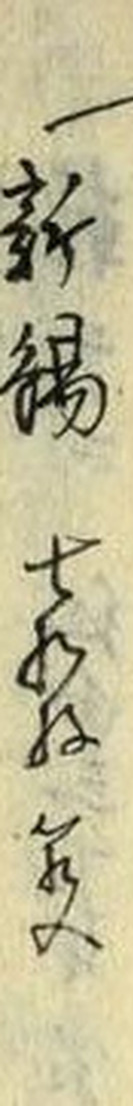新鯣七拾枚箱入
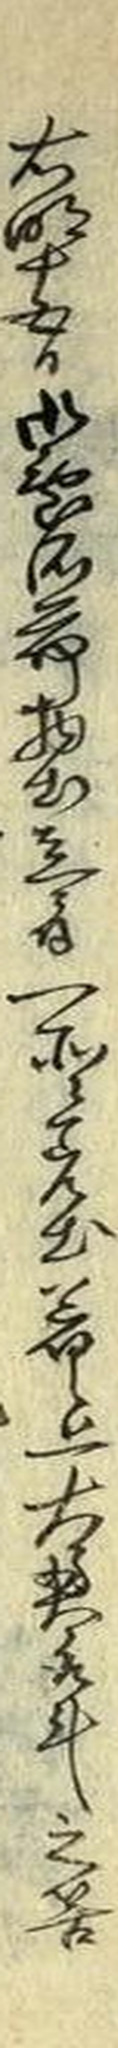右明十五日御台所荷物出立ニ付一所ニ差出着之上大奥取斗之筈
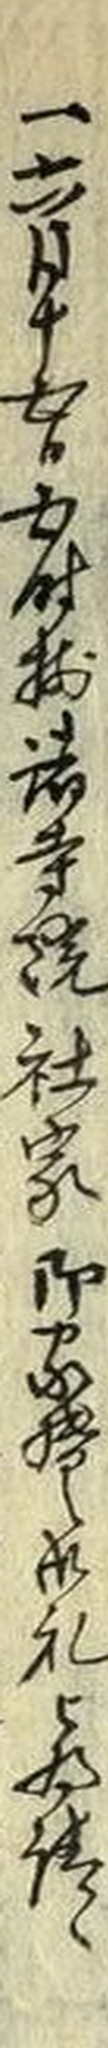一六月十五日五時揃諸寺院社家御家督之御礼被為請候
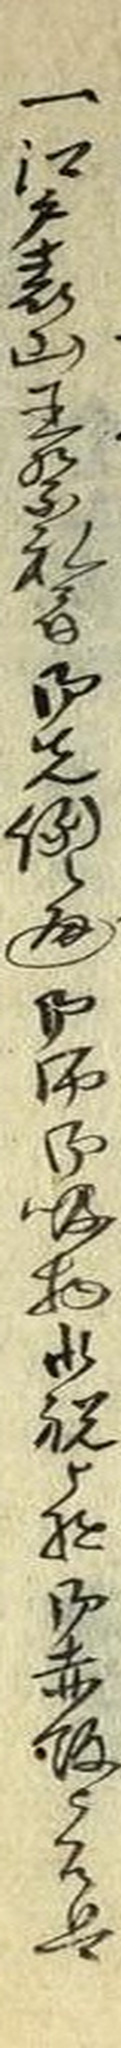一江戸表山王祭礼ニ付御先例之通御酒御吸物御祝被遊御赤飯被召上候
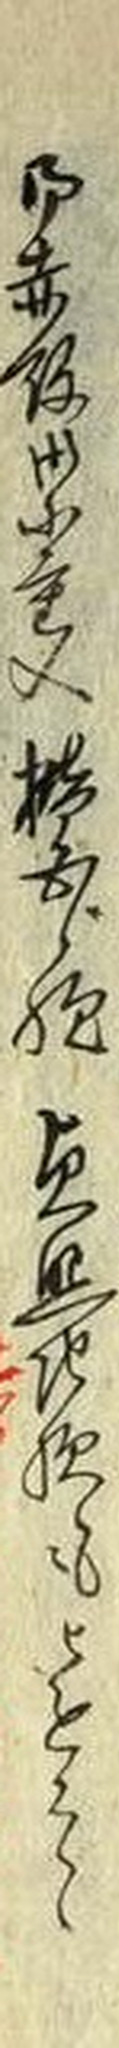御赤飯御小重入楷五郎様貞照院様ニも被進之
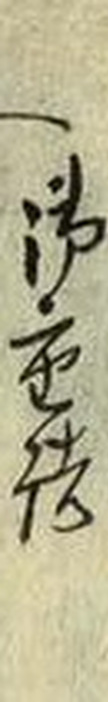御重詰
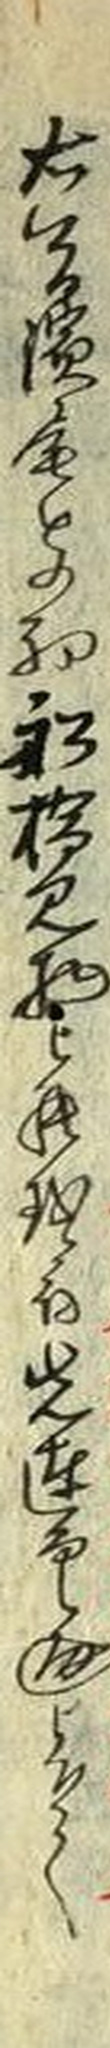右今日浜尾との初船橋見物被罷越候ニ付先達而之通被下之
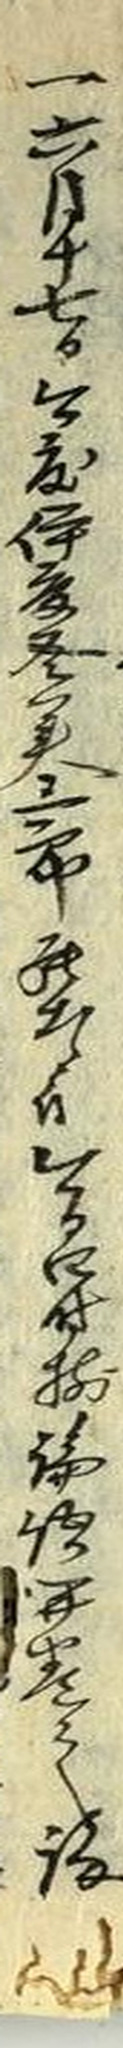一六月十七日今度伊藤登美三郎罷出候ニ付今日四時揃論語開巻之講
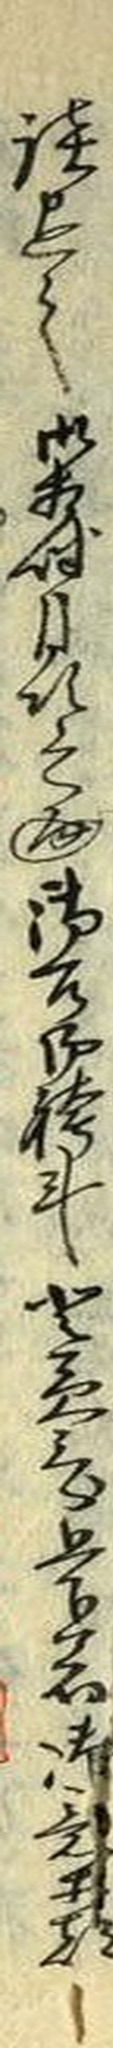釈申上之御相伴月次之通御召御袴斗登美三郎上下着御意等都
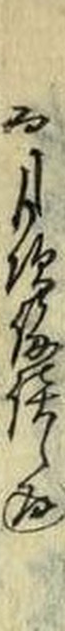而月次講談之通
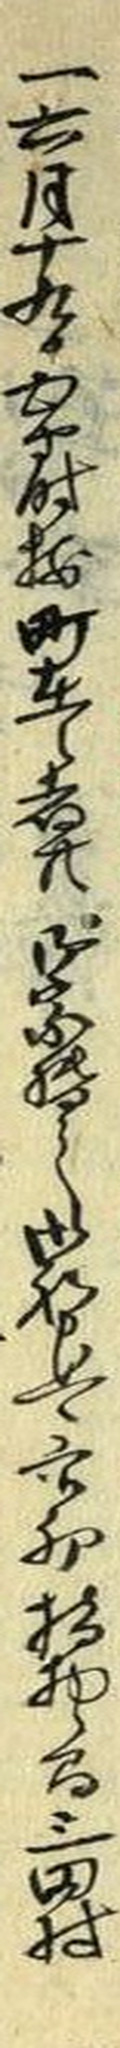一六月十九日五半時揃町在之者共御家督之御礼申上候最初指物之間三田村
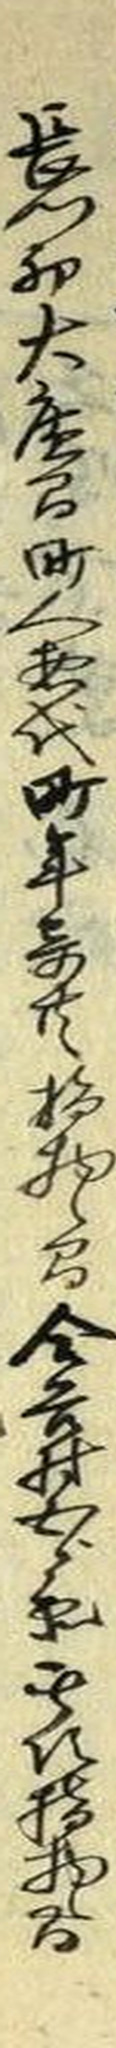長門初大広間町人惣代町年寄共指物之間合谷村五郎兵衛其次指物之間
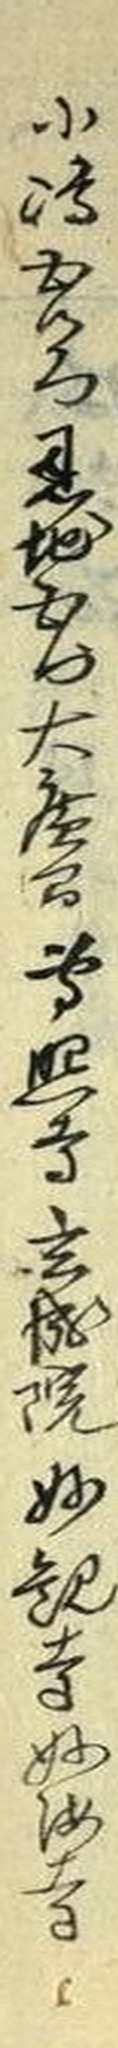小嶋五左衛門恩地五右衛門大広間専照寺玄成院妙観寺妙海寺
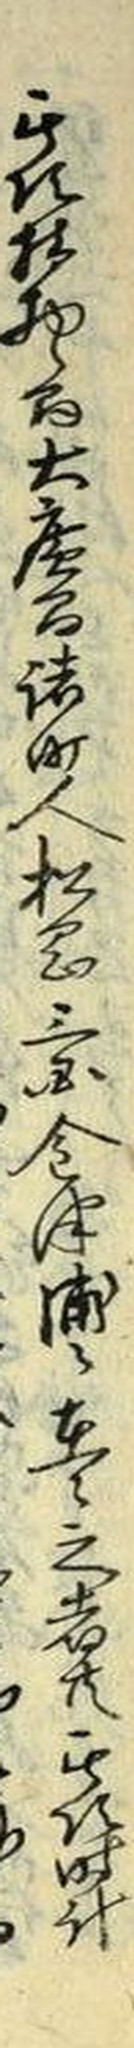其次指物之間大広間諸町人松岡三国金津浦々在々之者共其次時計
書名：少傅日録抄（斉善付側向頭取日記、江戸并道中、初入在国、逝去後…
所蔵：福井県文書館 Fukui Prefectural Archives
